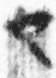釶（匜）
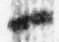一
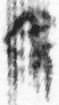禺（偶）
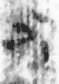又（有）
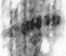一
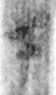才（在）
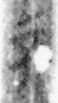長
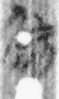{尾少}
